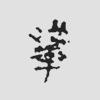𨌤
